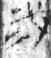戌
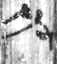丑
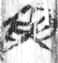寅
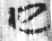巳
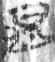是
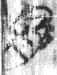{胃刀}（謂）
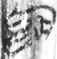○（陰）
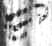日
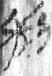利（利）
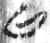㠯（以）
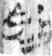爲
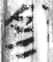室
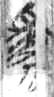○（家）
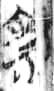取（娶）
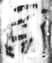取（娶）
